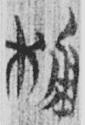○（輔）
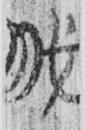我
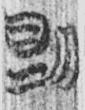則
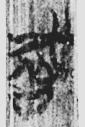戠（職）
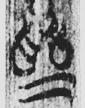爲
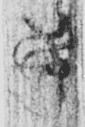民
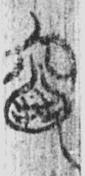○（仇）
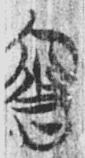○（讎）
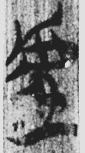○（吾）
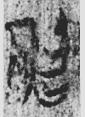○（聞）
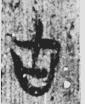古
